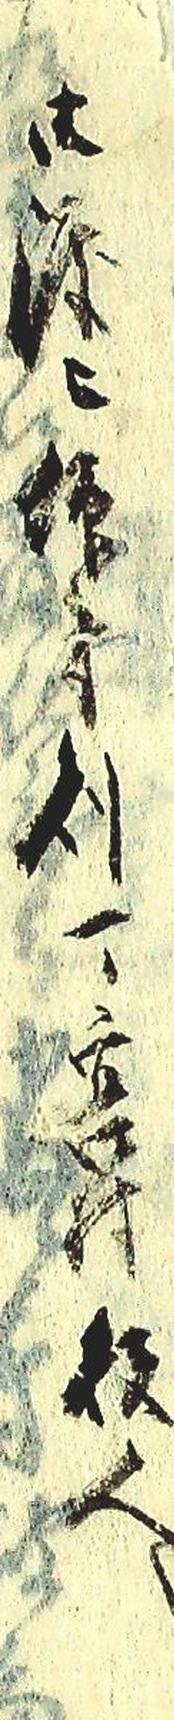御渡被仰付則一ノ宮村役人へ
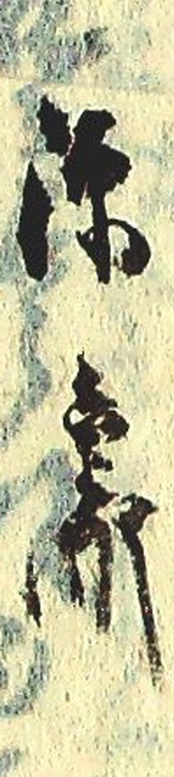源兵衛

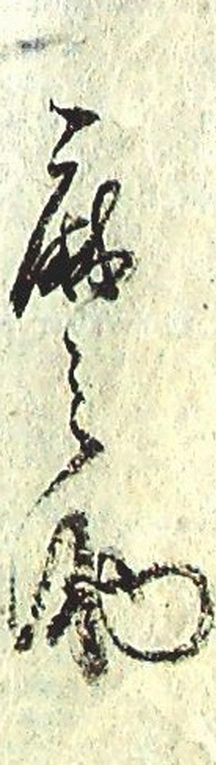麻之助
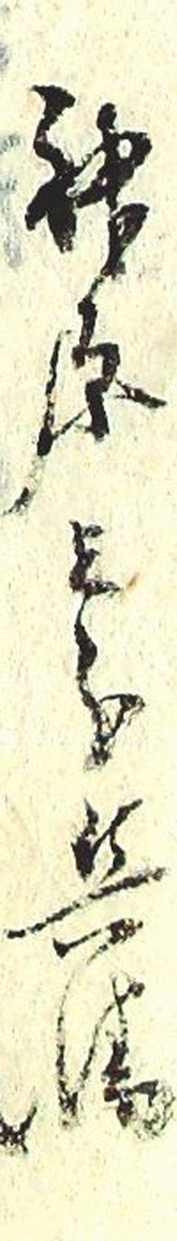同神原三郎兵衛
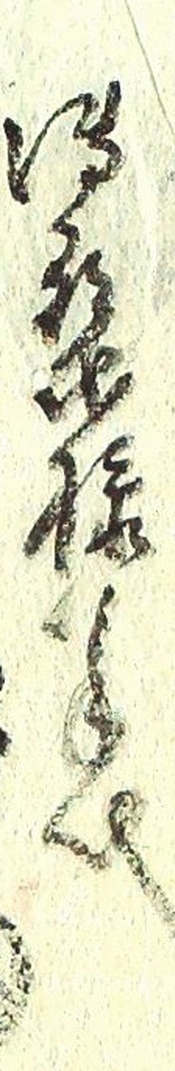御郡代様御手代
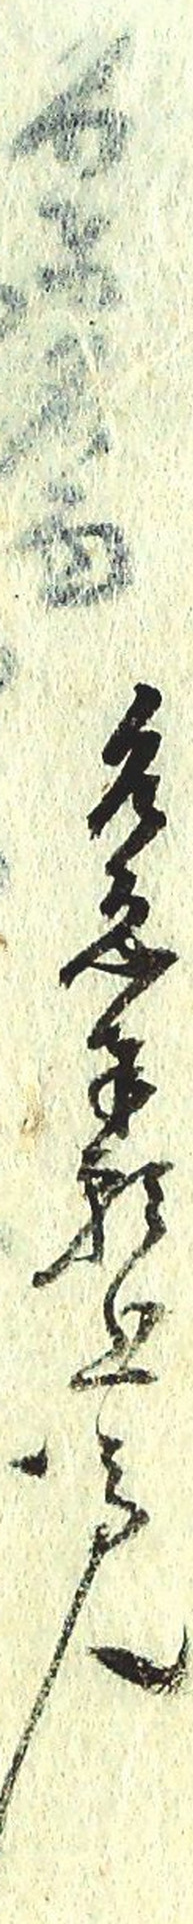乍恐奉願上覚
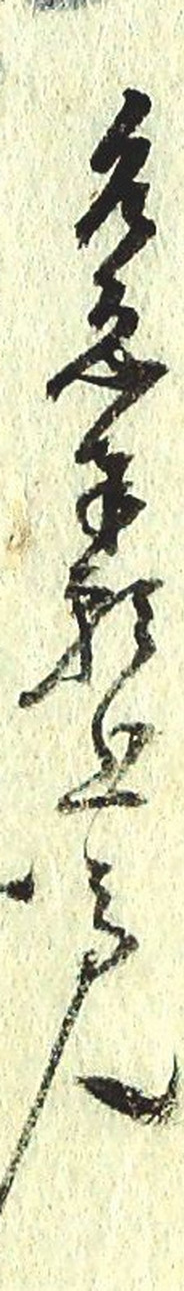乍恐奉願上覚
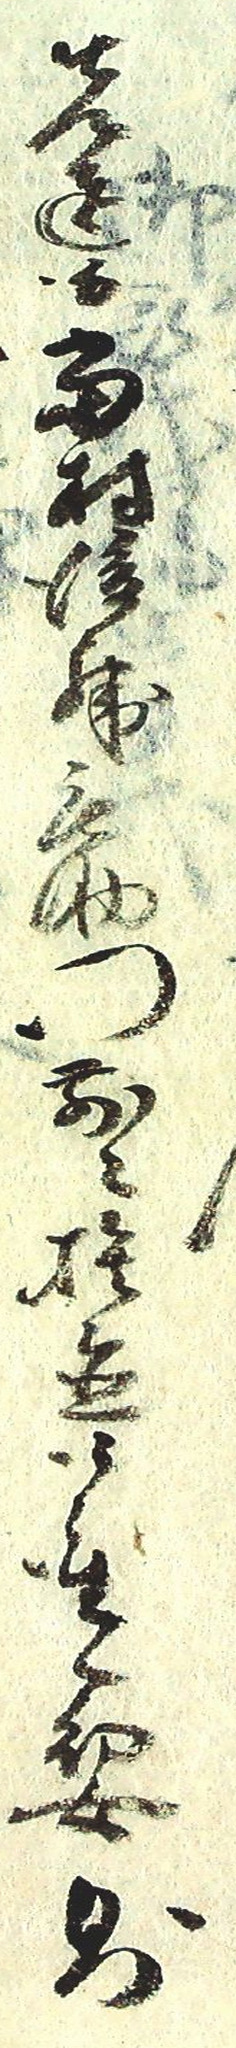先達て当村後藤庄助門前に捨置御座候幼女則
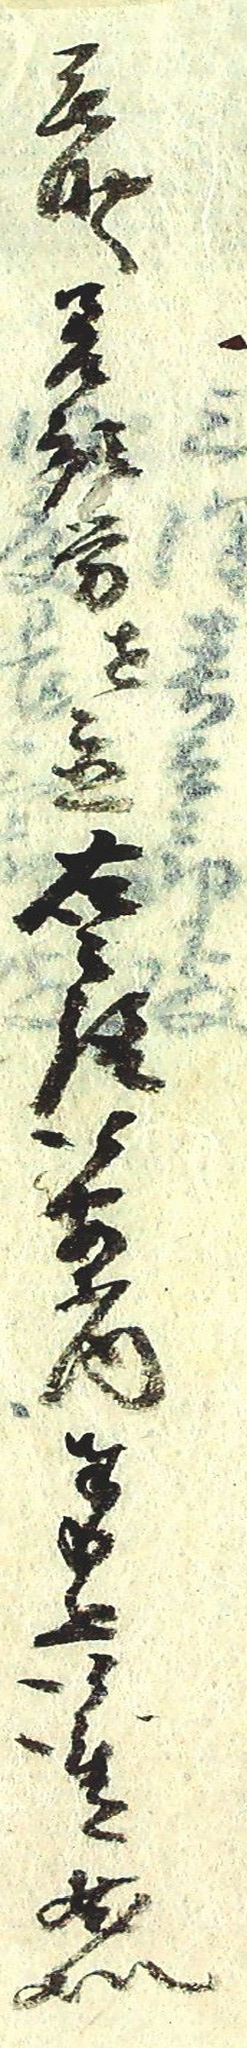庄助へ差預労せ置右之段御案内奉申上御座候然処
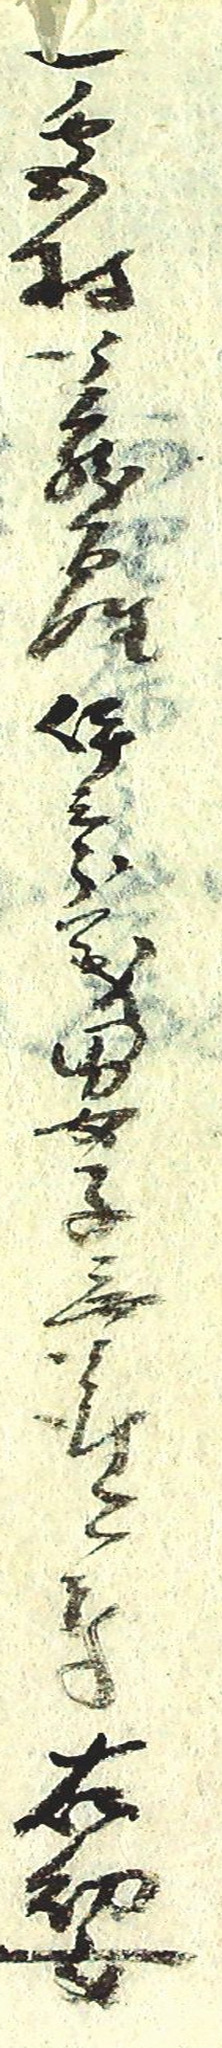一ノ宮村御蔵百姓伊三郎義男女子無御座候付右幼女
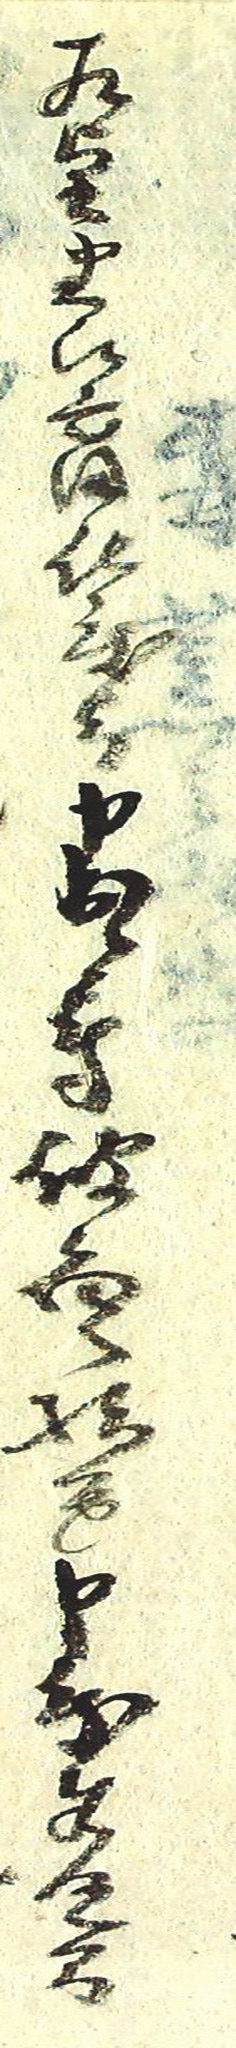相望養育仕度旨申出候に付彼者へ指遣申度奉存候間
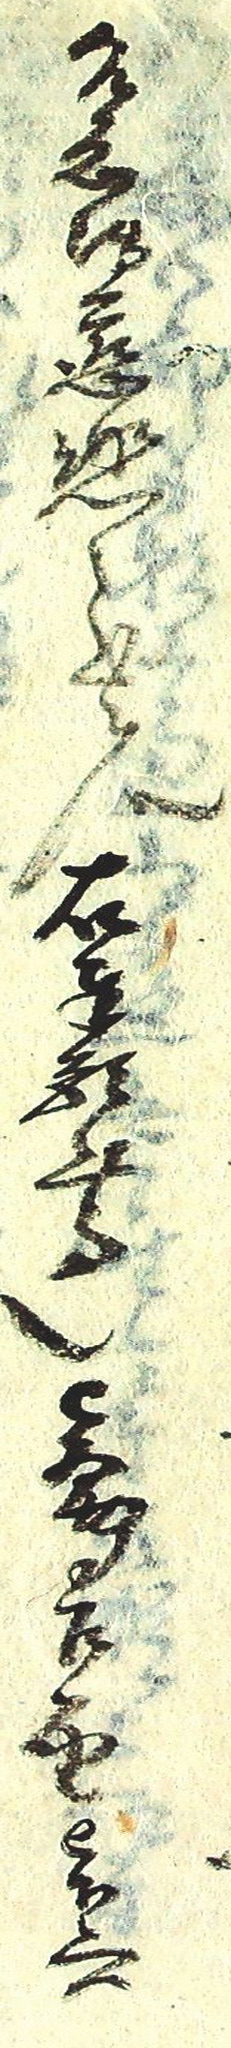乍恐御慈悲之上を以右奉願上通被為聞召届被下候へは
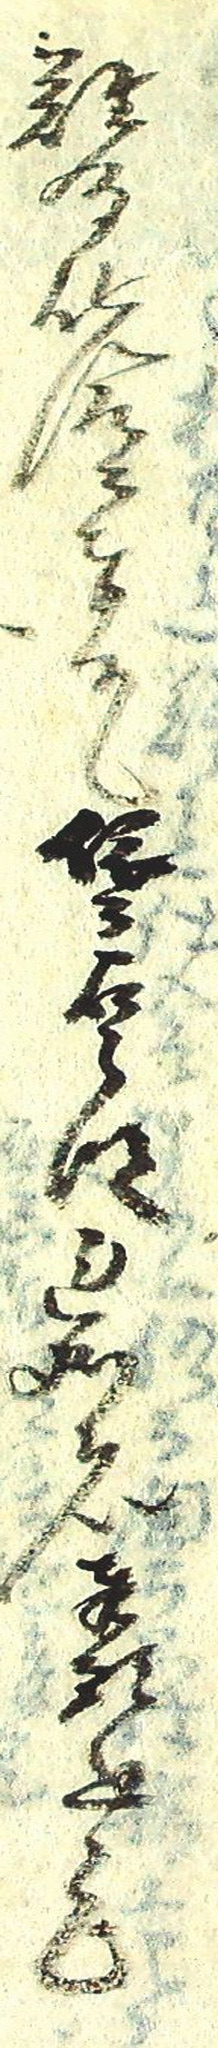難有仕合に奉存候依て右之段連判を以奉願上候以上
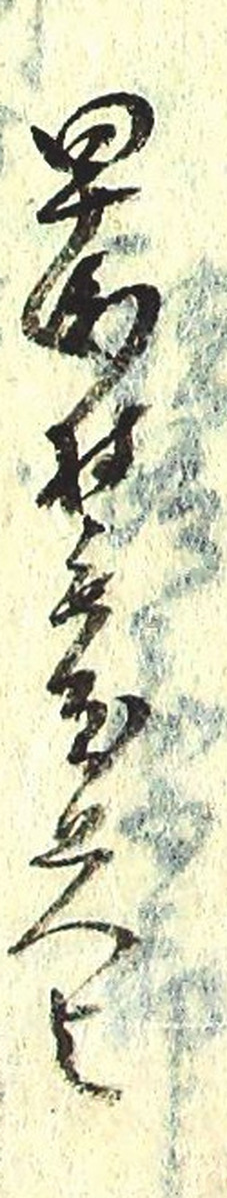早淵村庄屋五人与

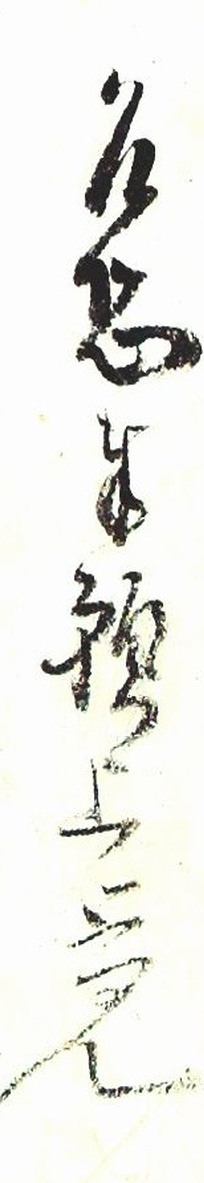乍恐奉願上覚
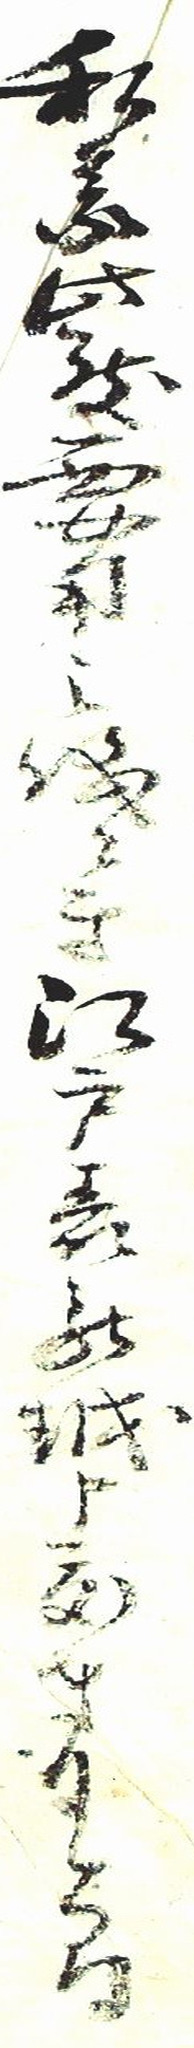私義此度要用之儀に付江戸表罷越申度奉存候間
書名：諸御願書控(弐番）
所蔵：鳴門教育大学 Naruto University of Education
